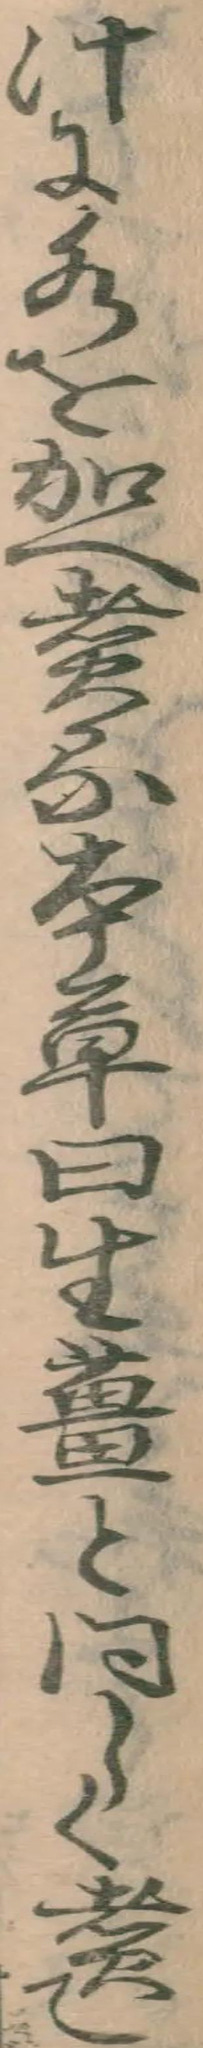汁に水を加へ煮る本草曰生薑と同しく煮て
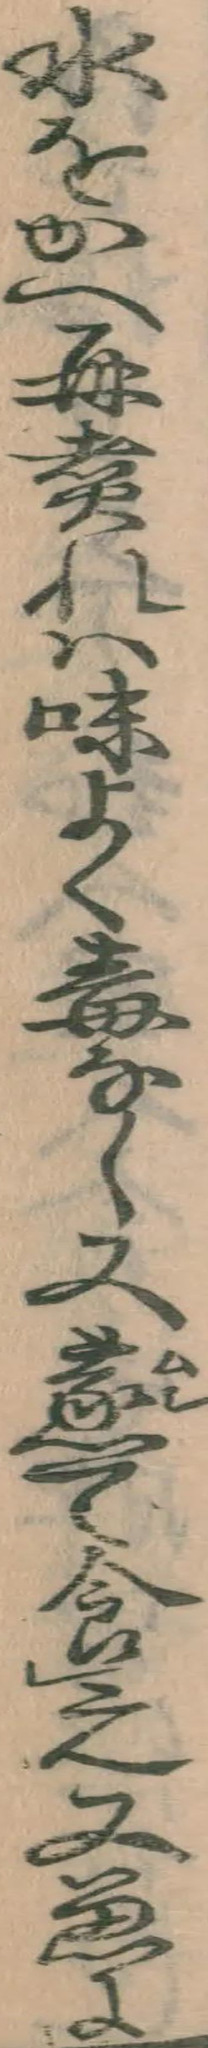水をかへ再煮れは味よく毒なし又蒸て食之魚に
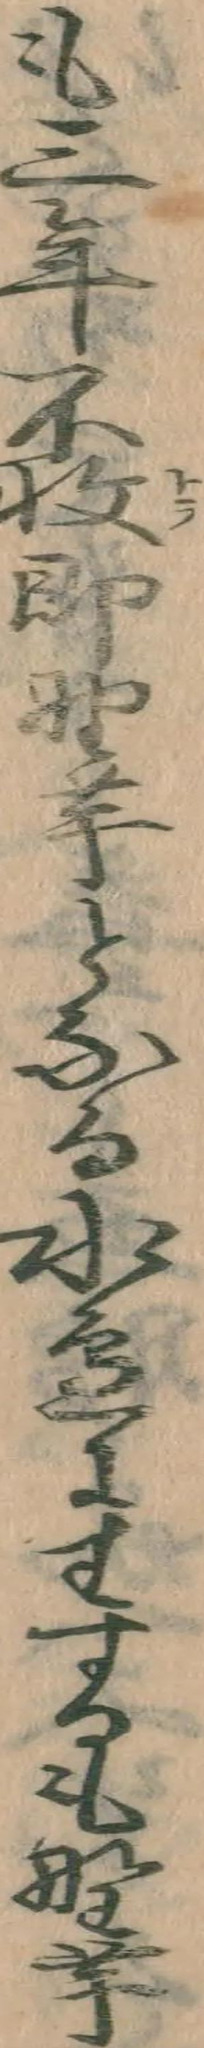も三年不収即野芋とるる水辺に生するも野芋
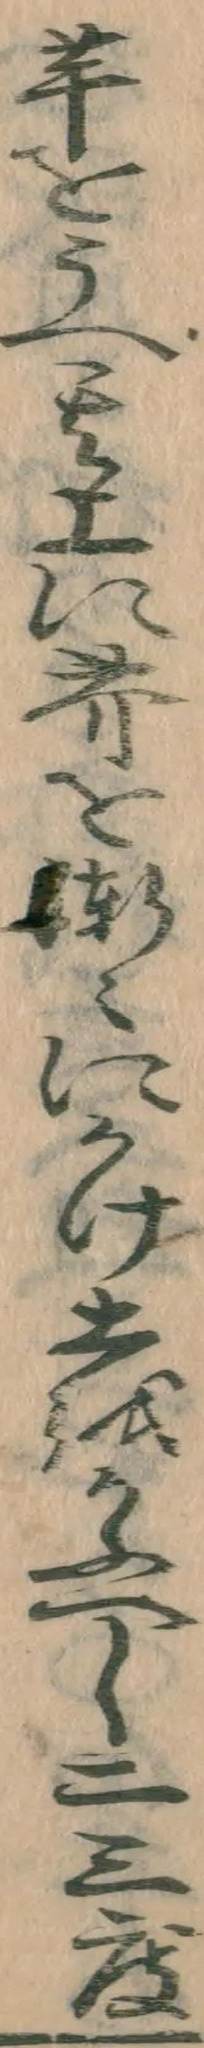芋をうへ其土に芥を漸々にかけ土をかふへし二三度
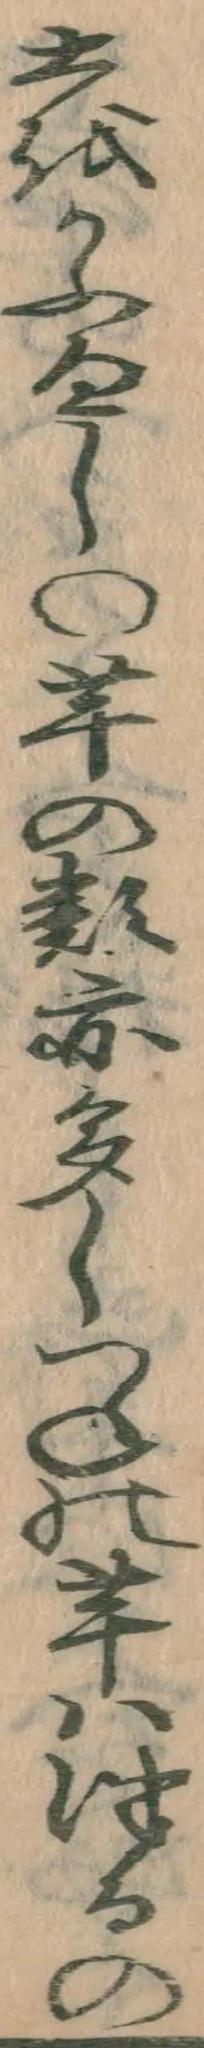土をかふへし〇芋の類亦多しつねの芋はつるの
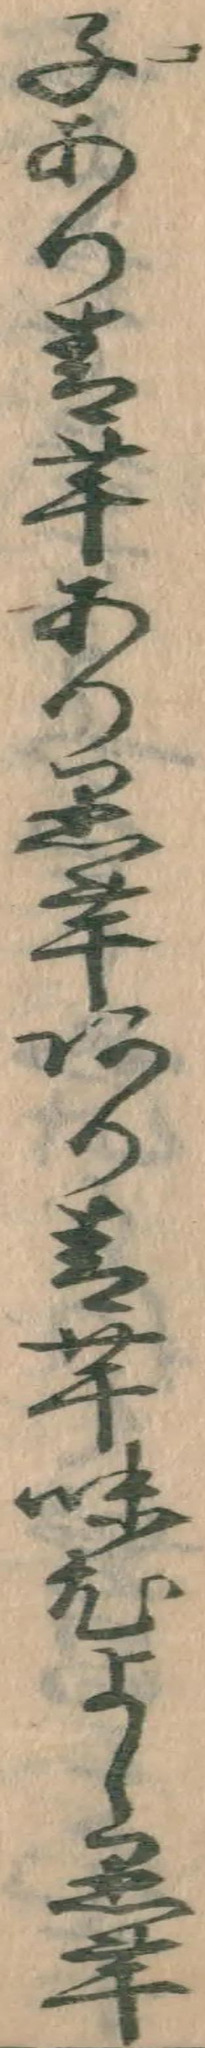子あり青芋あり黒芋あり青芋味尤よし黒芋
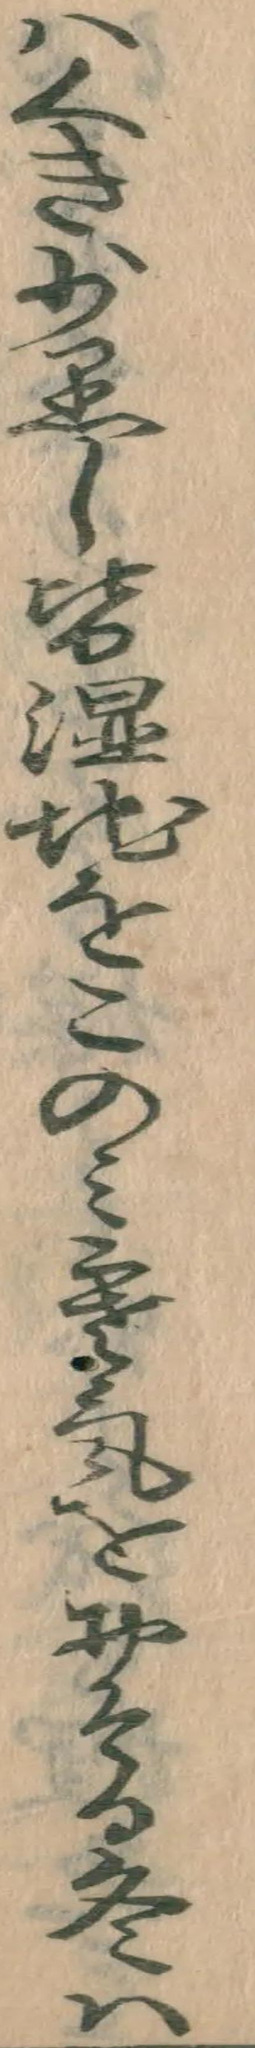はくき少黒し皆湿地をこのみ寒気をおそる冬は
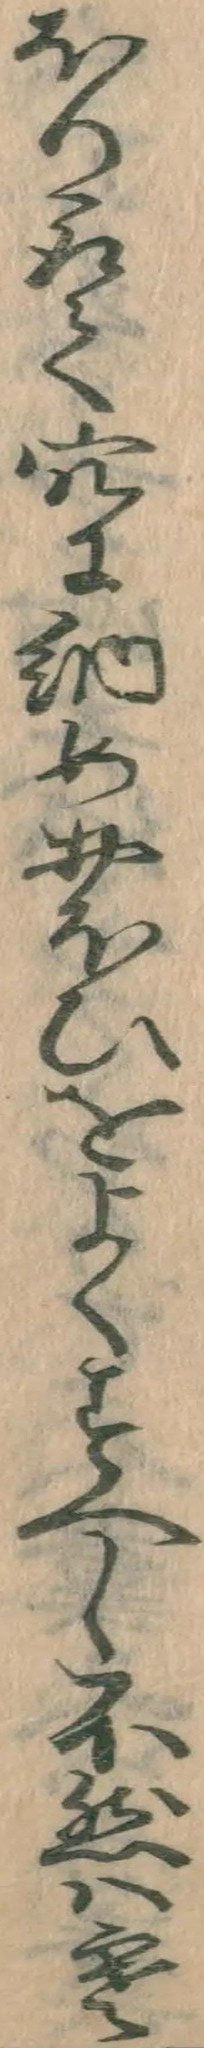ほり取て穴に納めおほひをよくすへし不然は寒
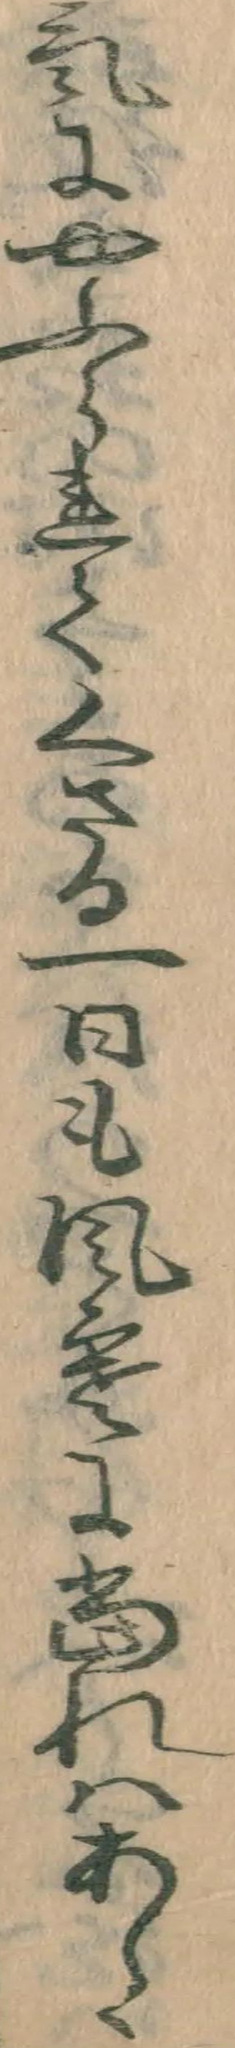気にやふられてくさる一日も風寒に当れはあしく

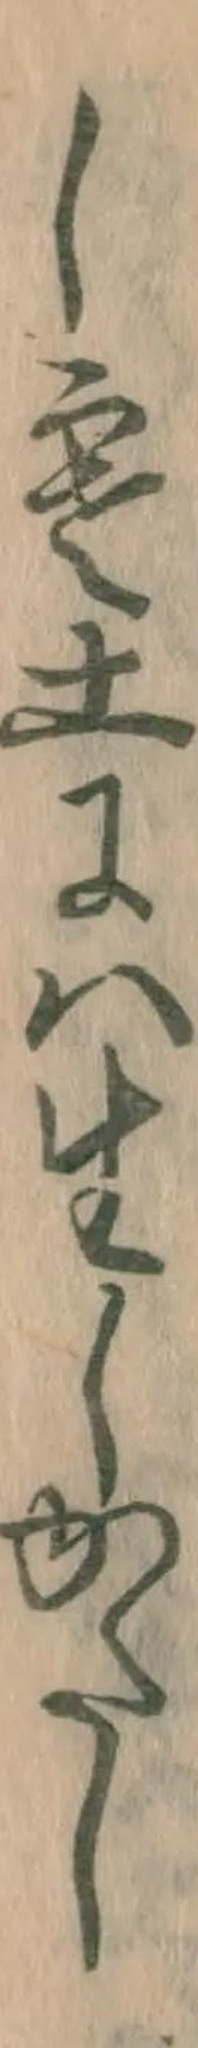し寒土には生しかたし
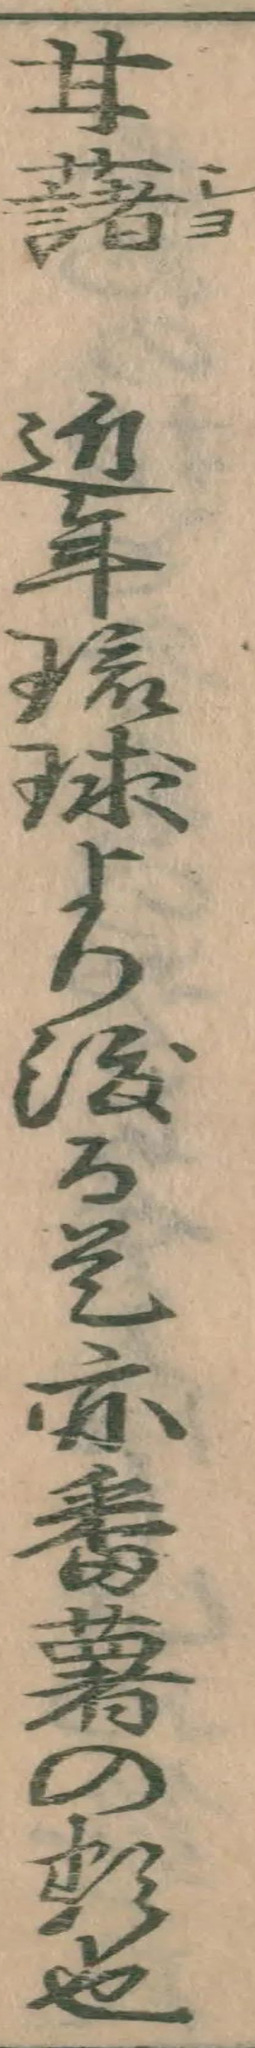甘藷近年琉球より渡る是亦番薯の類也
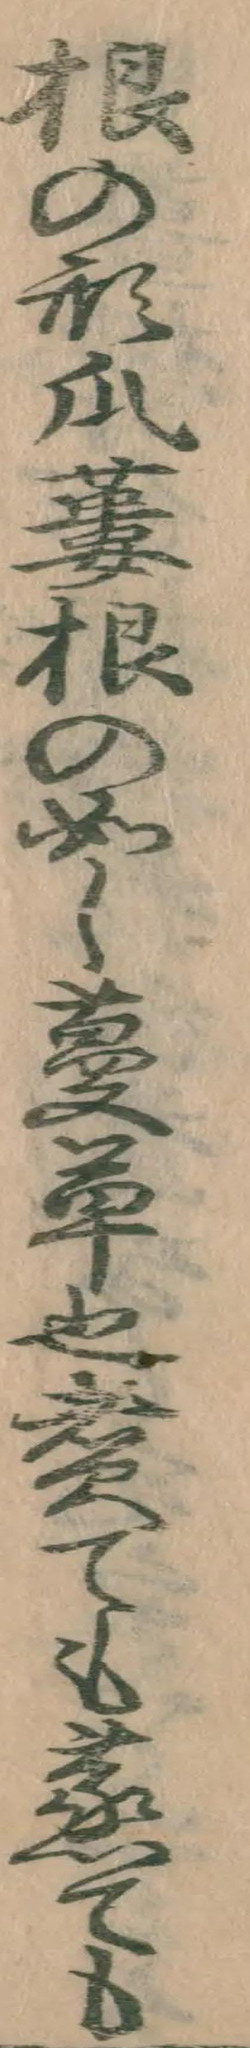根の形瓜蔞根の如し蔓草也煮ても蒸しても
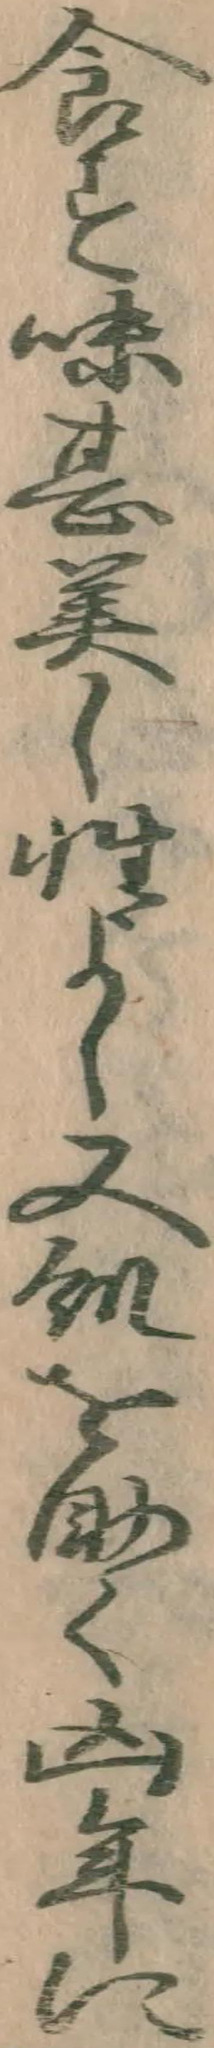食す味甚美し性よし又飢を助く凶年に
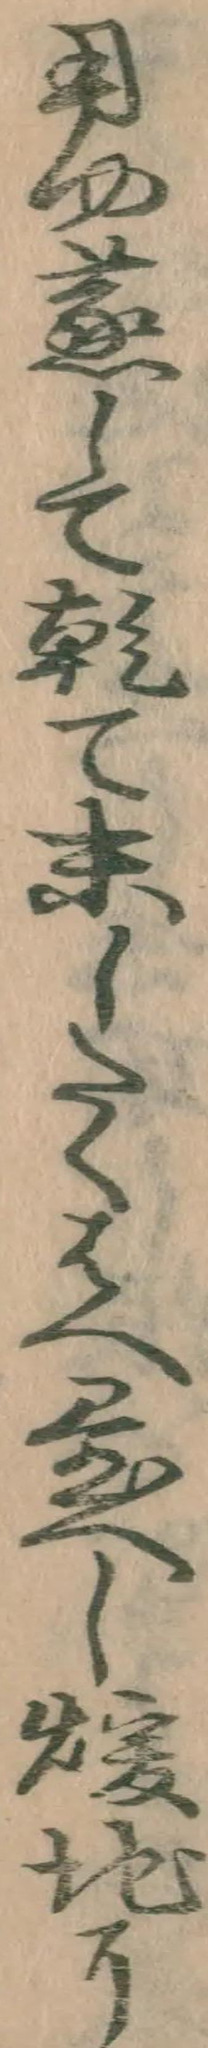用ゆ蒸して乾て末したくはへ置へし煖地に
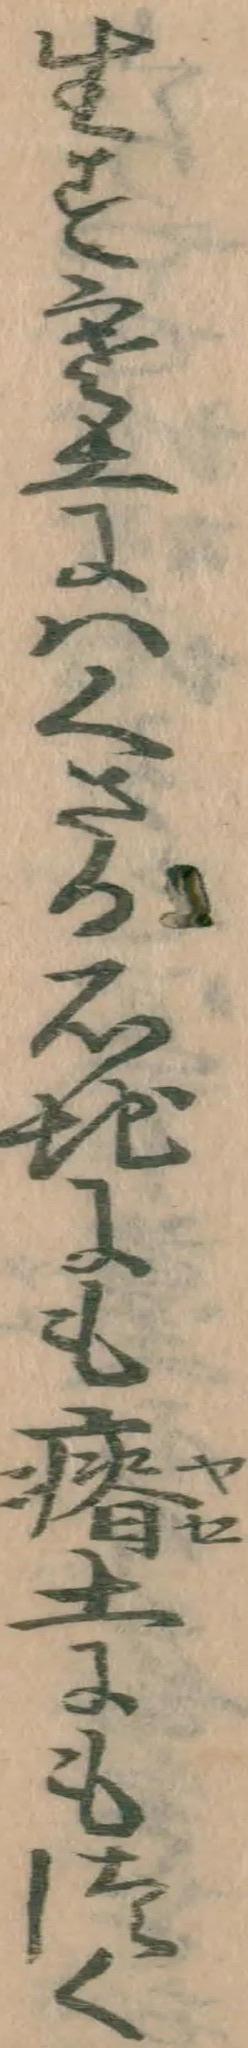生す寒土にはくさり石地にも瘠土にもつく
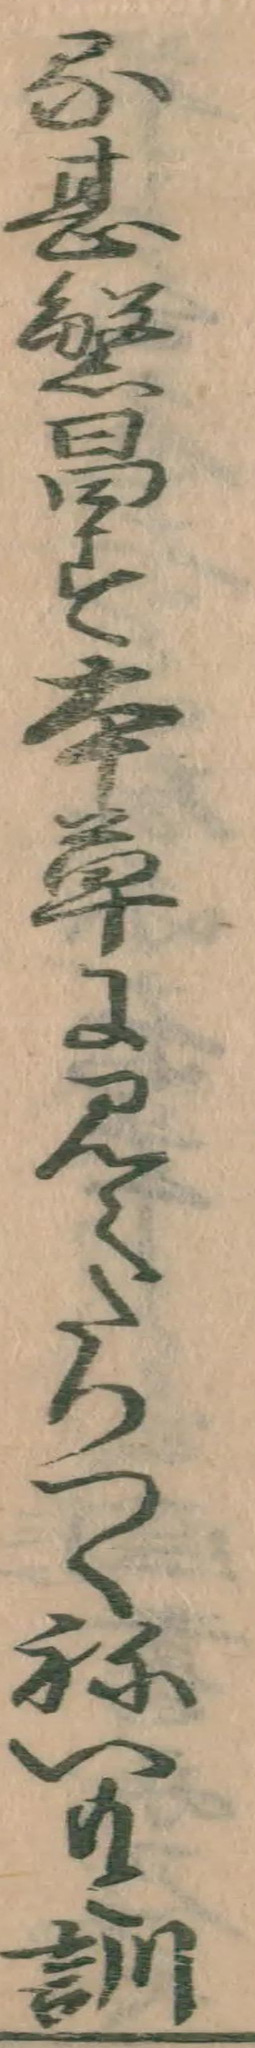る甚繁昌す本草に見えたりつくねいもと訓
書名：菜譜 3巻
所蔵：国立国会図書館 National Diet Library, JAPAN
